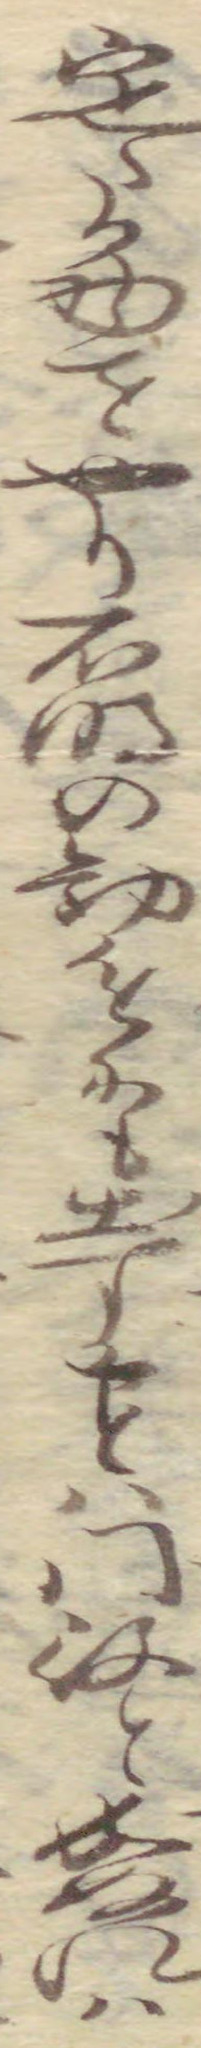定たる物をやり不時の勧進にも出すかことは門役と成ぬれは
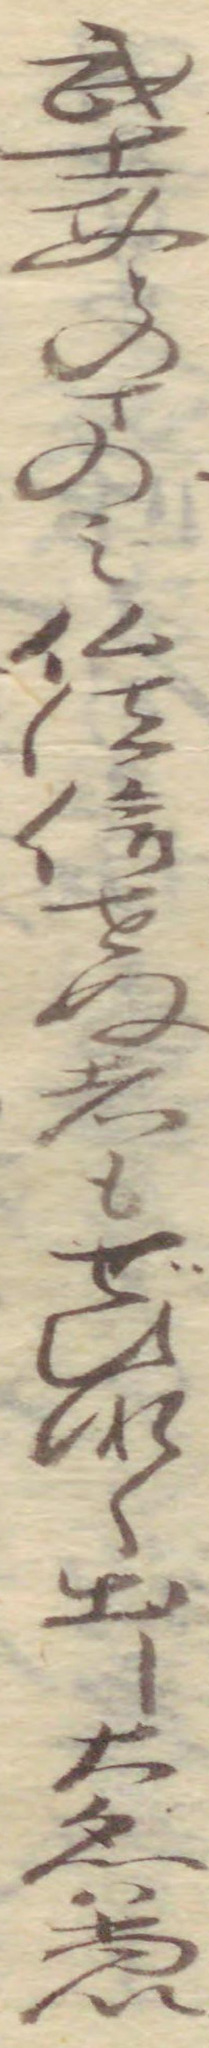武士なとのさのみ仏法信せぬ者もぜひなく出し大名は尚以
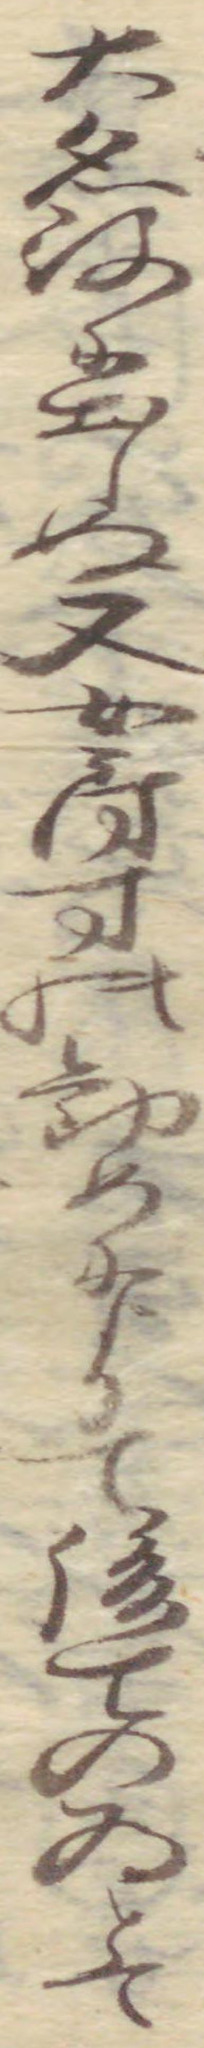大名役に出しぬ又女房方の勧めによりて後生の為とて
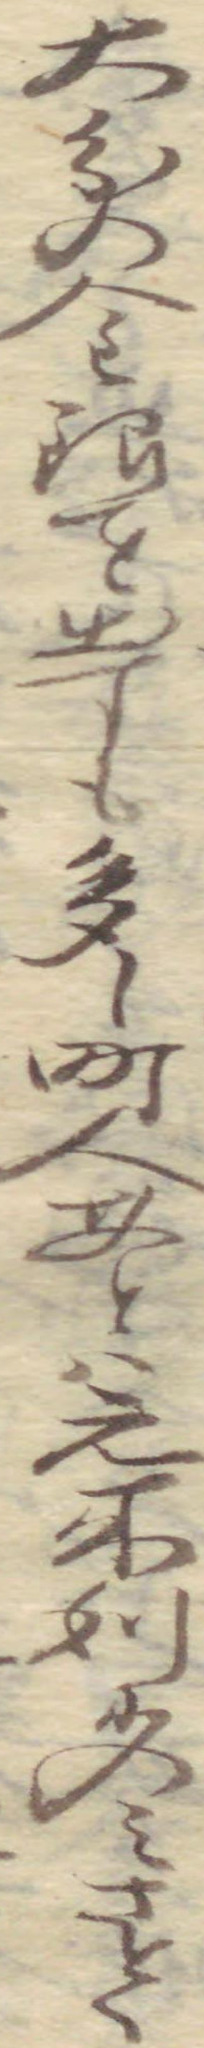大分の金銀を出すも多し町人なとは元来利にのみさとく
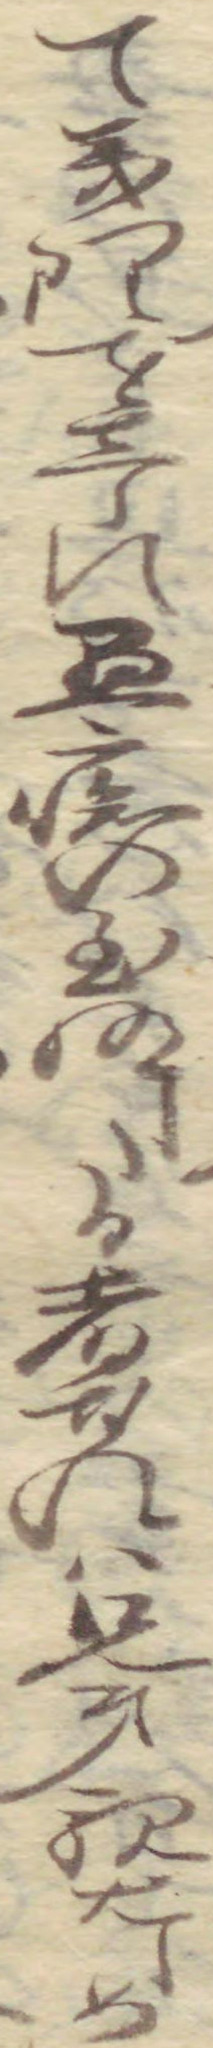て義理をしらす愚痴の至極したる者なれは兄弟親はしめ
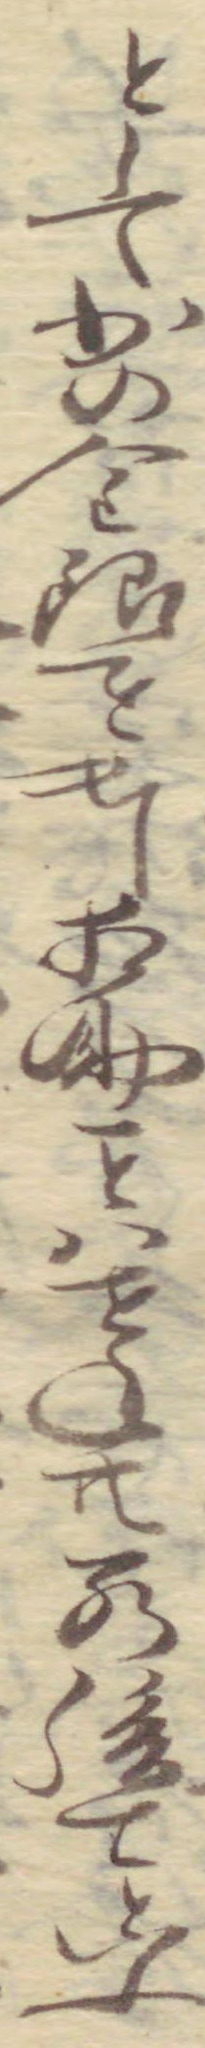として少の金銀を出し相助ことはせね共若後生といふ
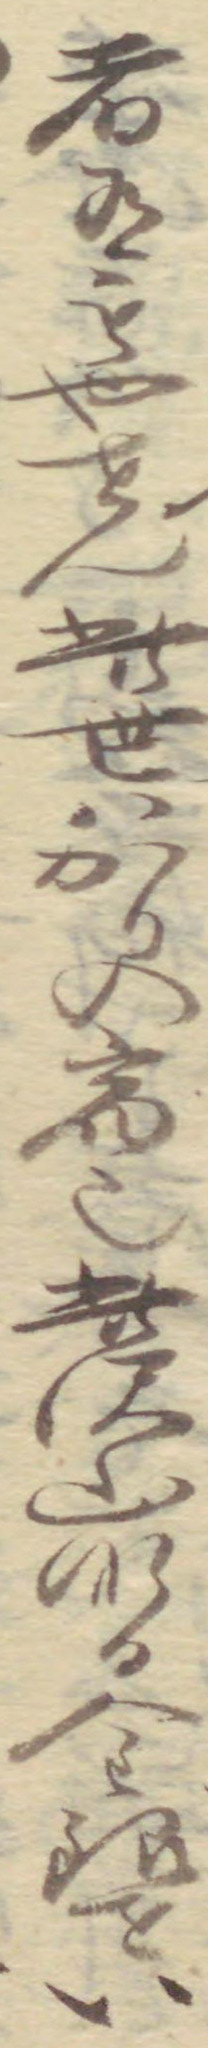者有もやせん此世はかりの宿也此沢山なる金銀をい
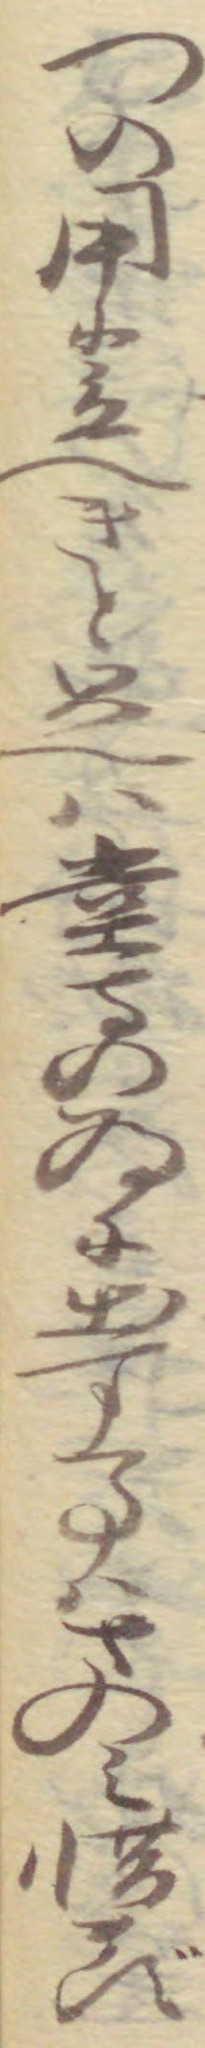つの用に立へきと思へは堂寺の為に出す事はさのみ惜まず
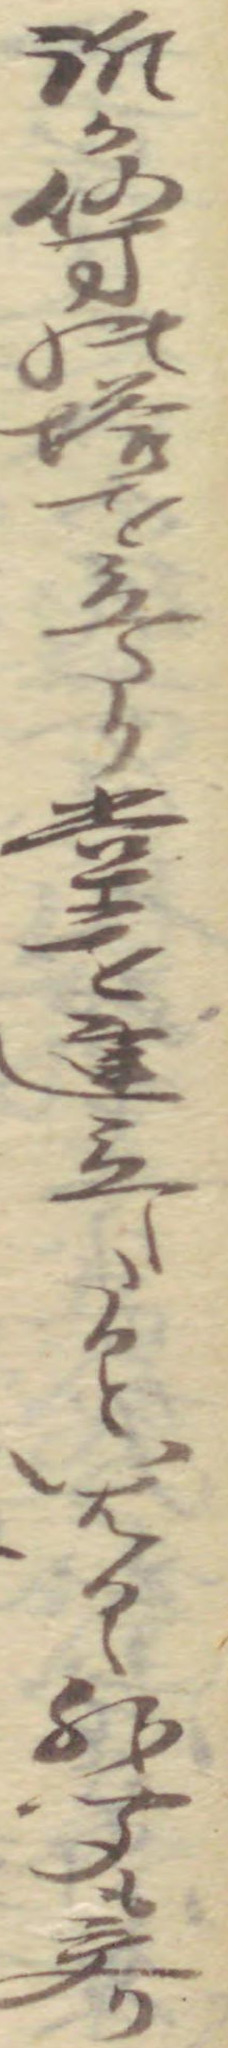誰か何方の塔を立たり堂を建立したるといはるゝ外聞も交り
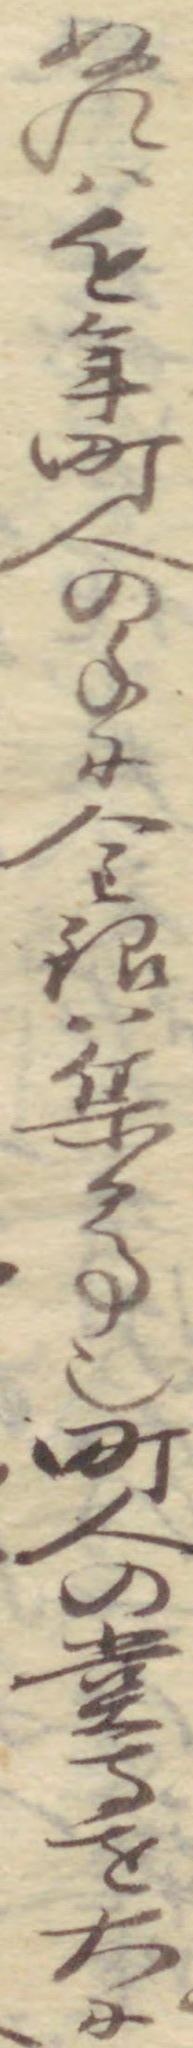ぬれは近年町人の手に金銀は集る事也町人の堂寺を大に
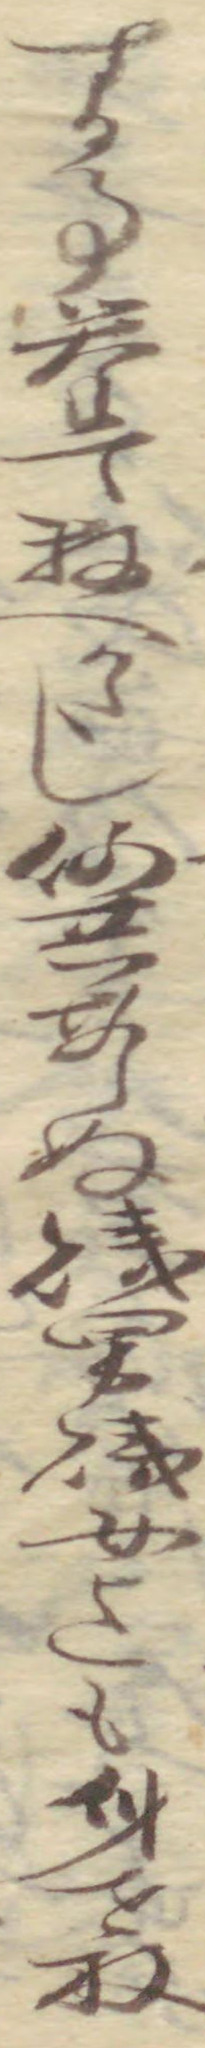する事挙て数へかたし何共ならぬ賎男賎女迄も身を放
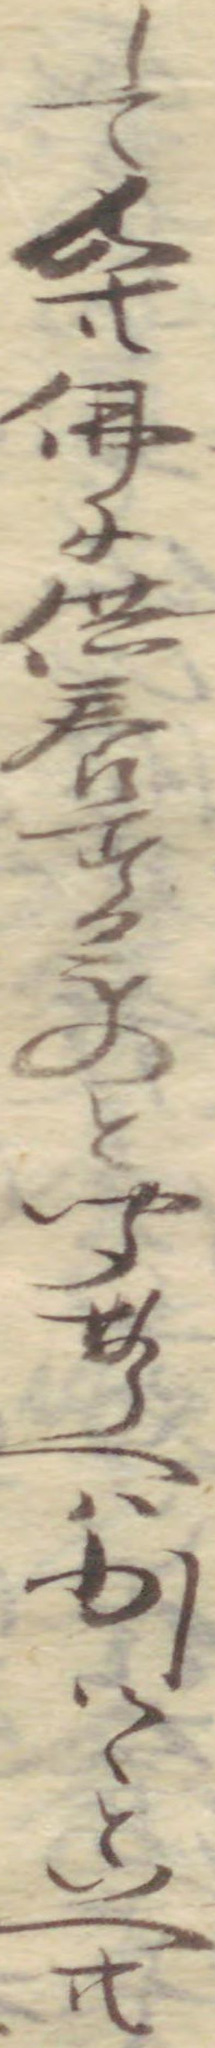して成共仏に供養するものと聞ならへは少しツヽといへ共
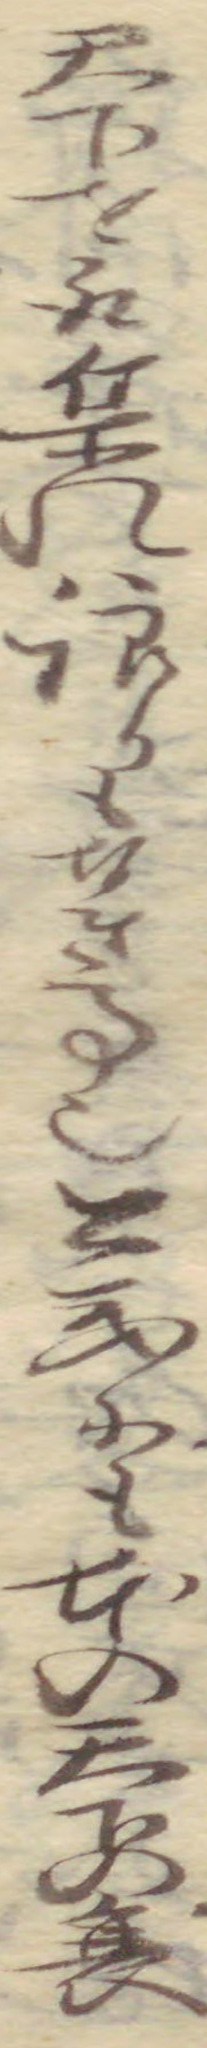天下を取集れは限りもなき事也公義にも本の天下の衰
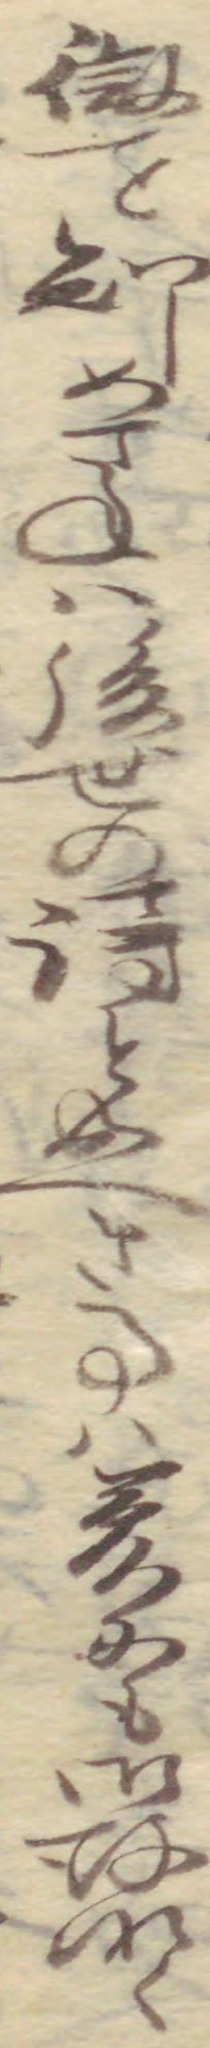微を知しめさねは後世の謗と成へき事は夢にも御存なく
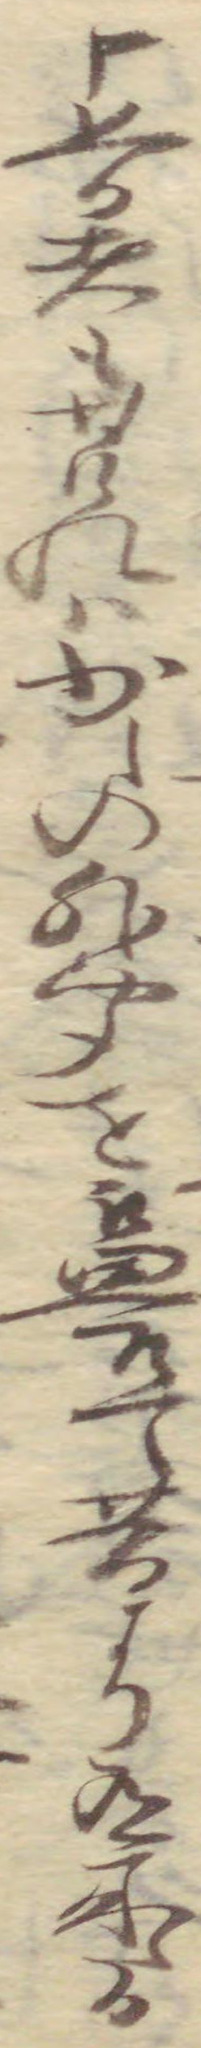申上る者もなけれは少しの外聞を被思召て昔より有来たる
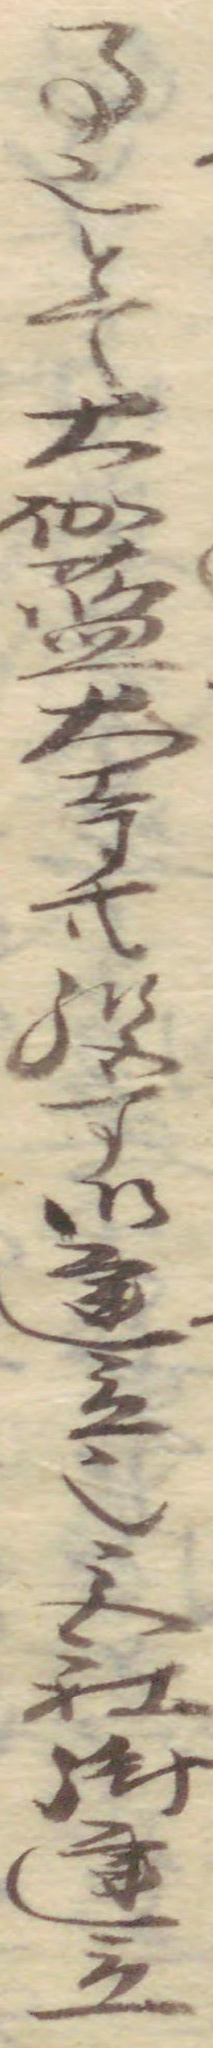事也とて大伽藍大寺共絶す御建立也宮社御建立
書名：鶯宿雑記. 巻263-264
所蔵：国立国会図書館 National Diet Library, JAPAN
